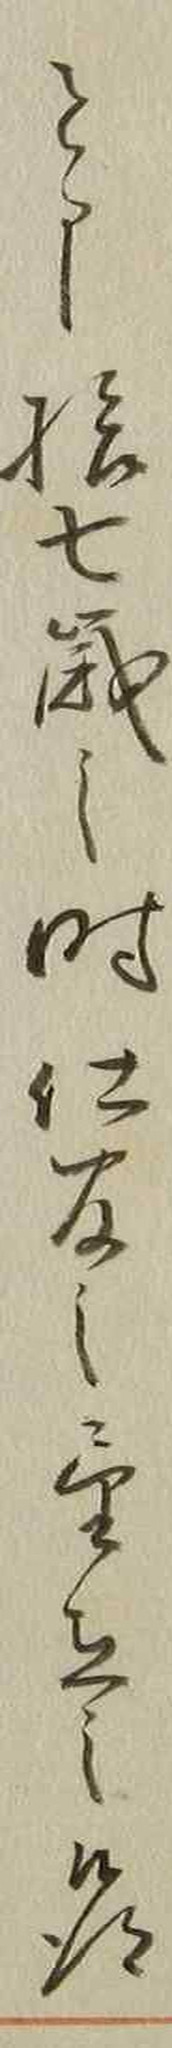と申拾七歳之時仕官之望在之候得
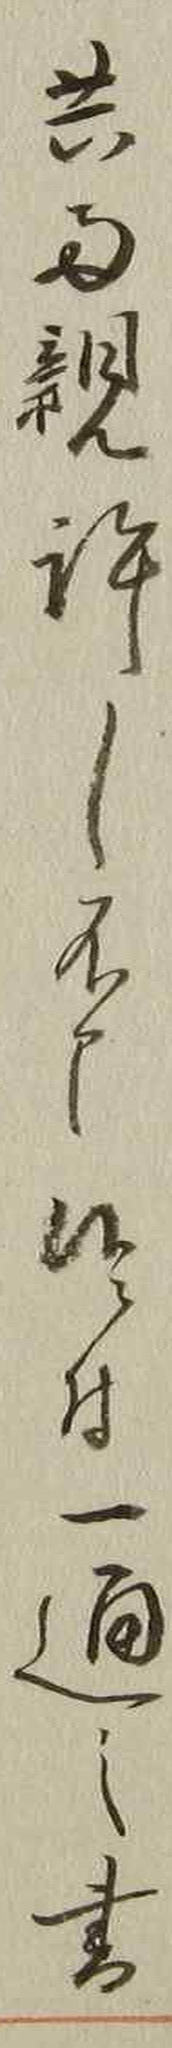共両親許し不申候ニ付一通之書
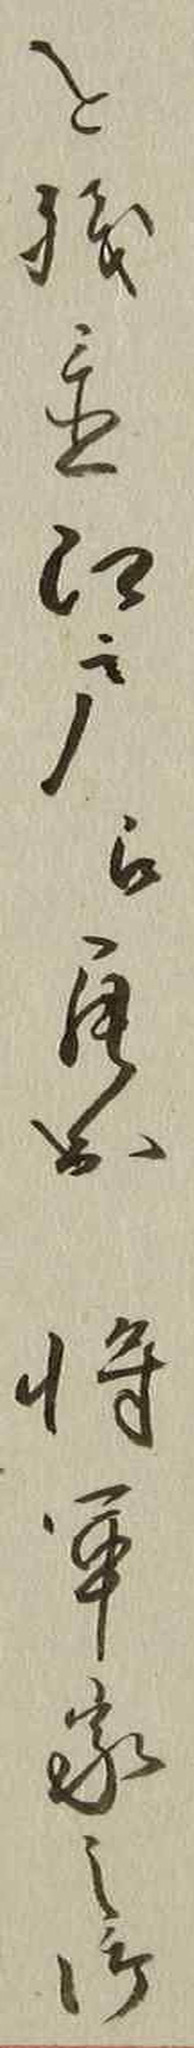を残置江戸江罷出将軍家之御
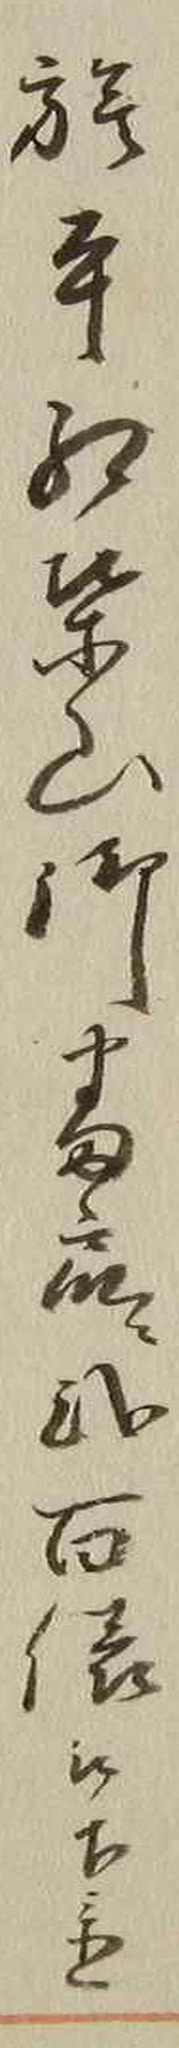旗本紅葉山御番衆ニ弐百俵被下置
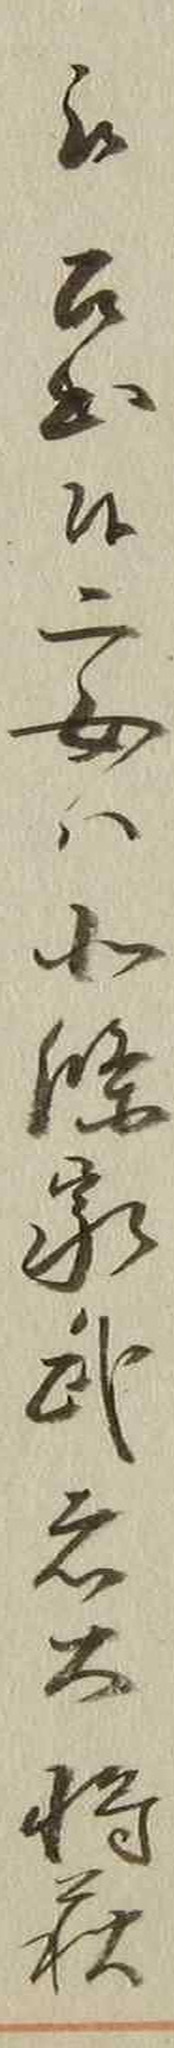被召出候二女ハ北条家武者大将萩
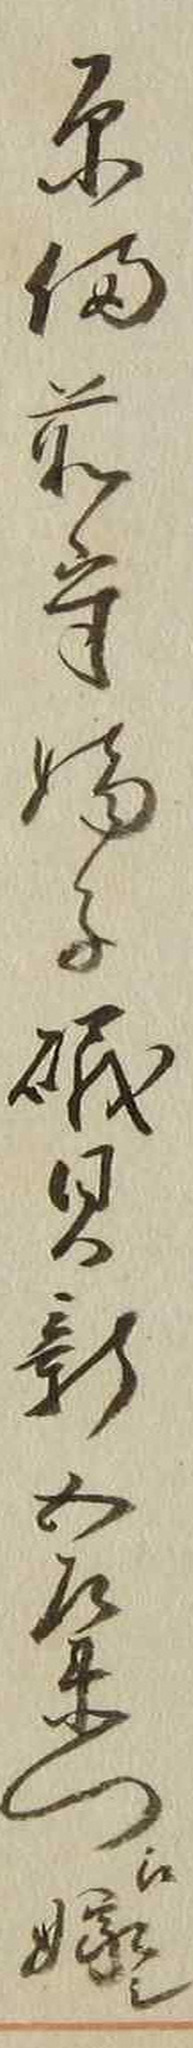原備前守嫡子磯貝新五左衛門江嫁シ
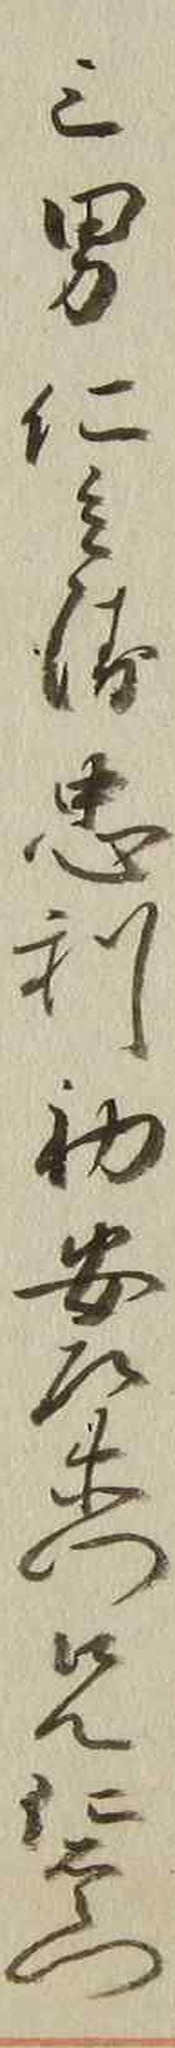三男仁兵衛忠利初安左衛門兄仁右衛門
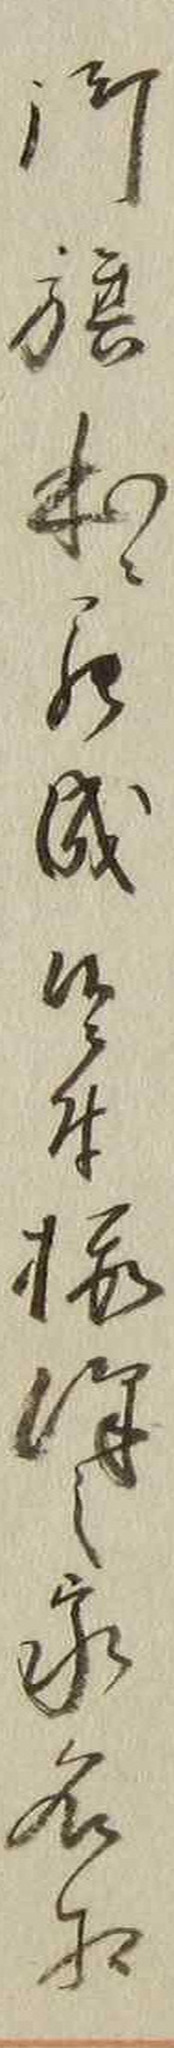御旗本ニ罷成候ニ付梅沢之家名相
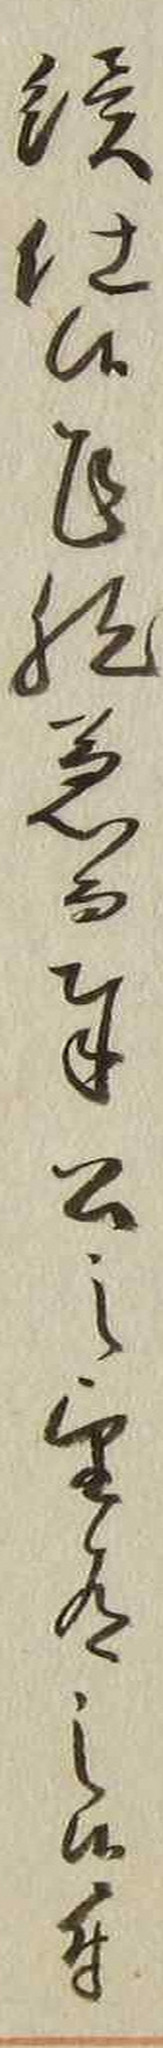続仕候乍然兼而奉公之望有之候ニ付
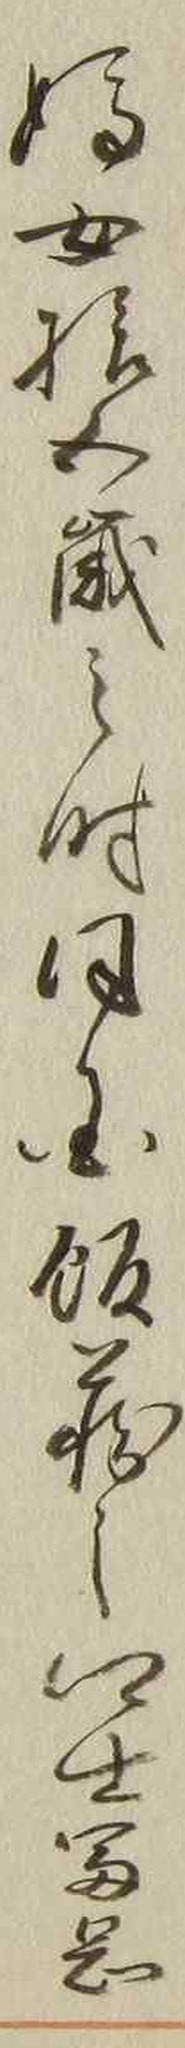嫡女拾五歳之時同国飯蔵之郷士富岡
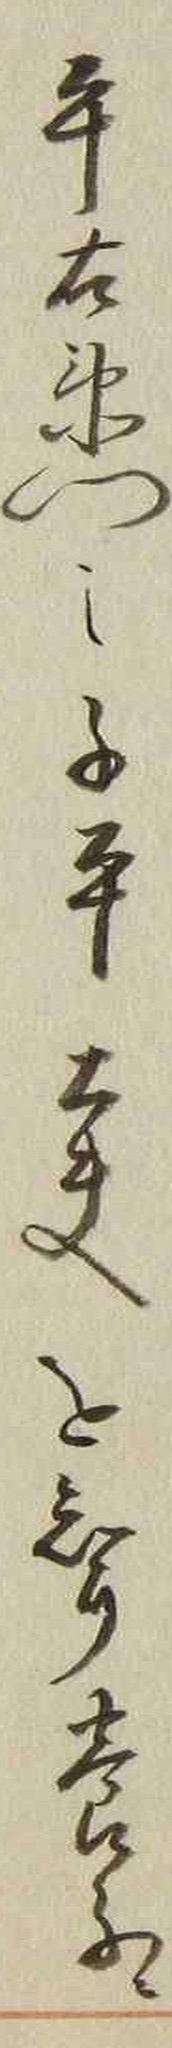平右衛門之子平大夫を婿養子ニ
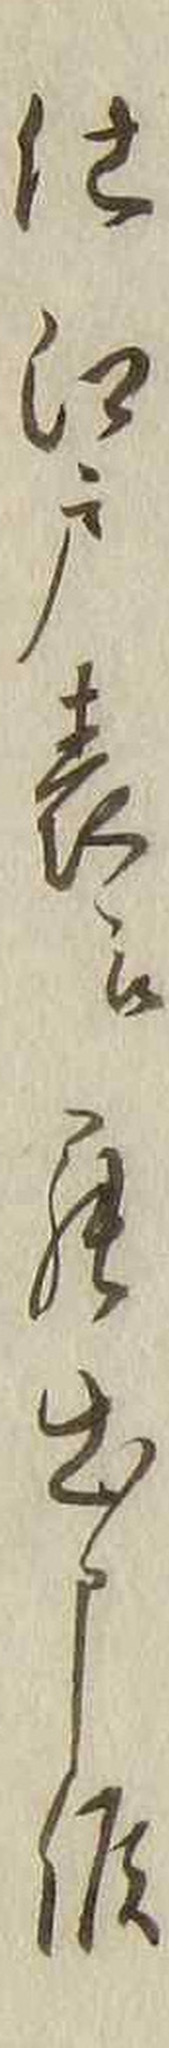仕江戸表江罷出申候

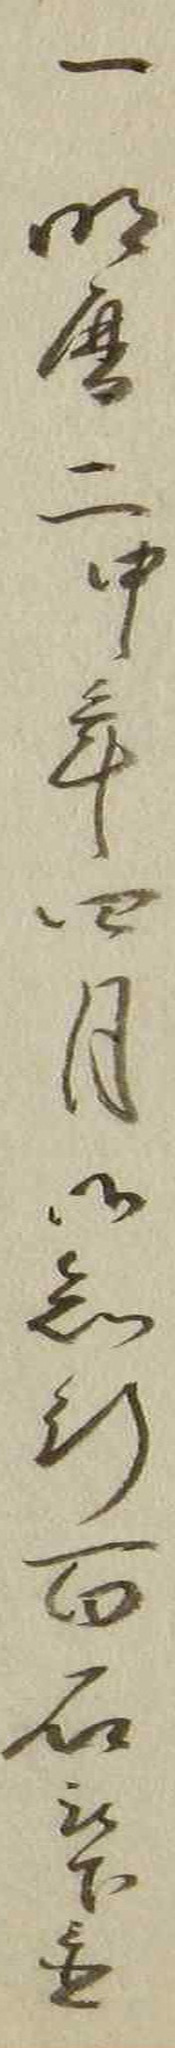一明暦二申年四月御知行百石被下置
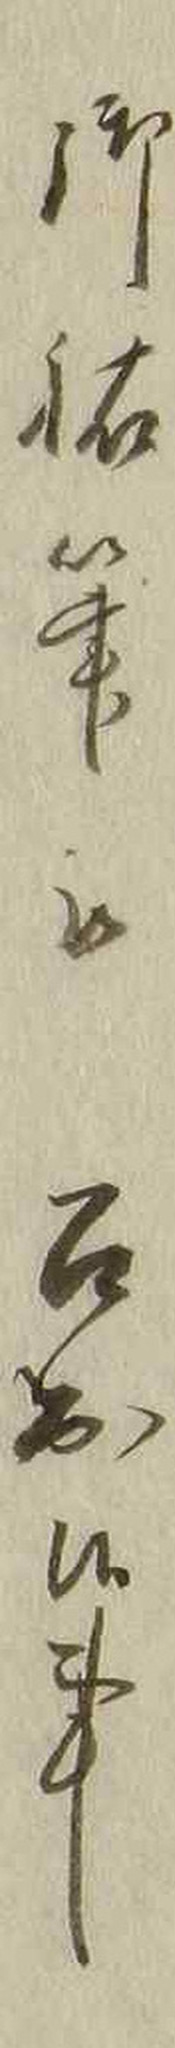御祐筆被召出候事
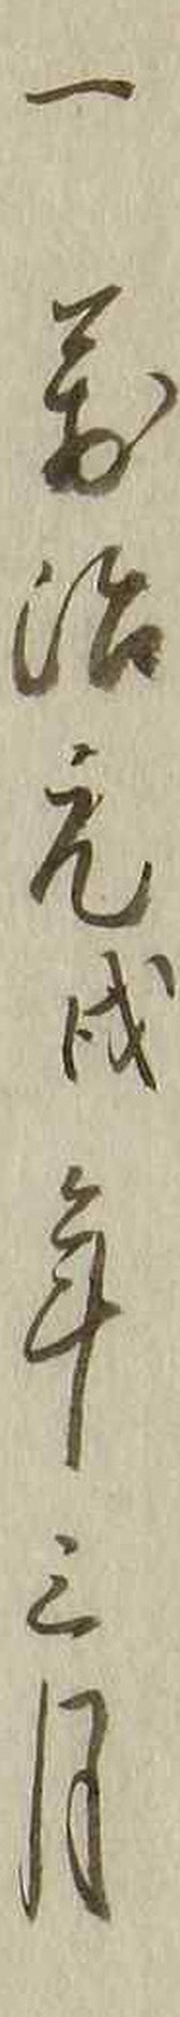一万治元戌年三月
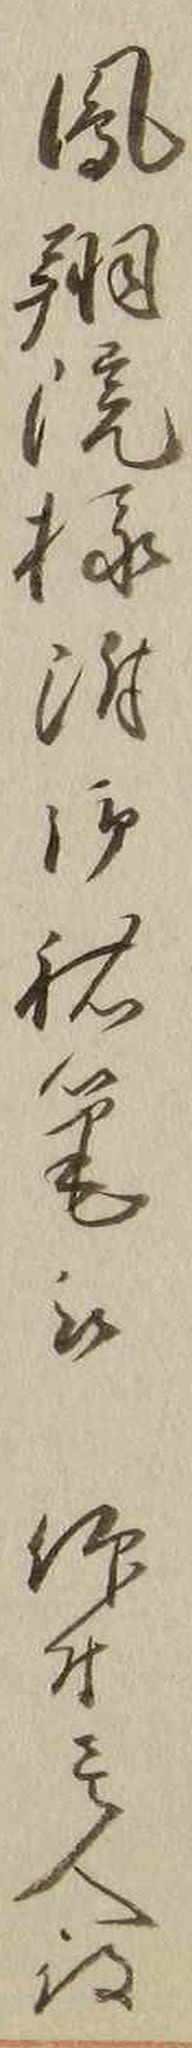鳳翔院様附御祐筆被仰付壱人役
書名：諸士系譜　巻之122　よ之部5
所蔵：会津若松市立会津図書館
